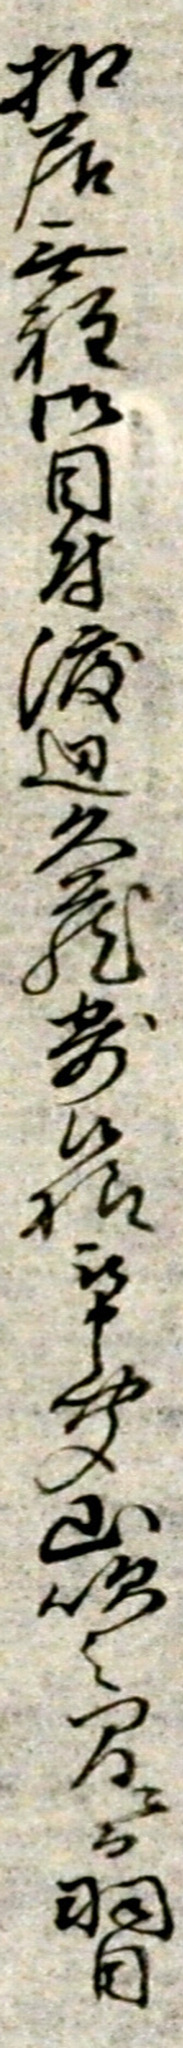扣居無程御目付渡辺久蔵寄候様被申聞山吹之間二而羽目
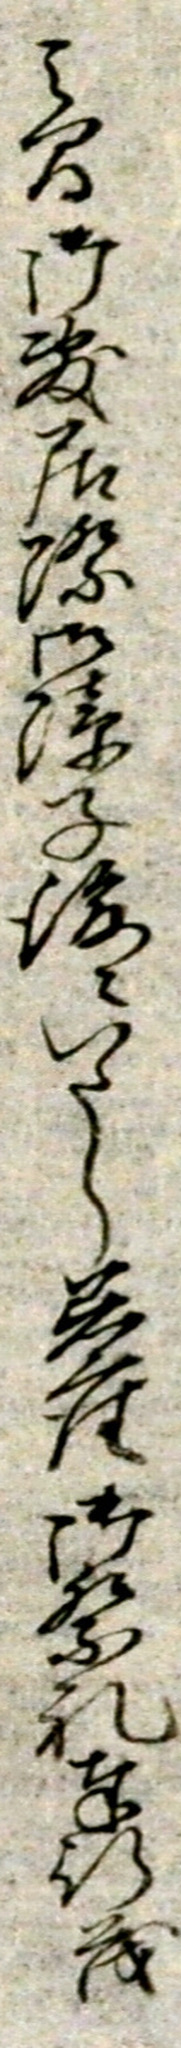之間御敷居際御障子後二いたし着座御祭礼奉行も
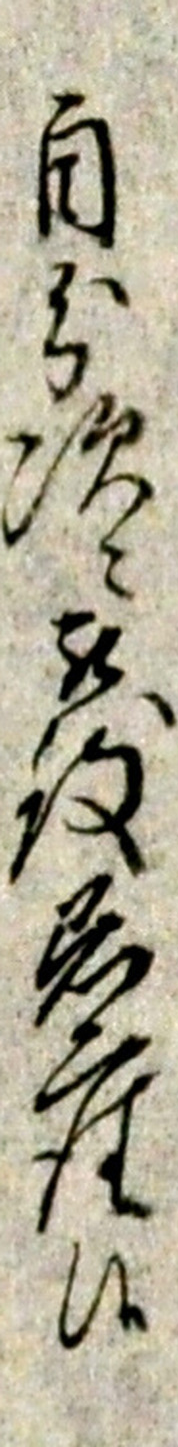自分次ニ被致着座候
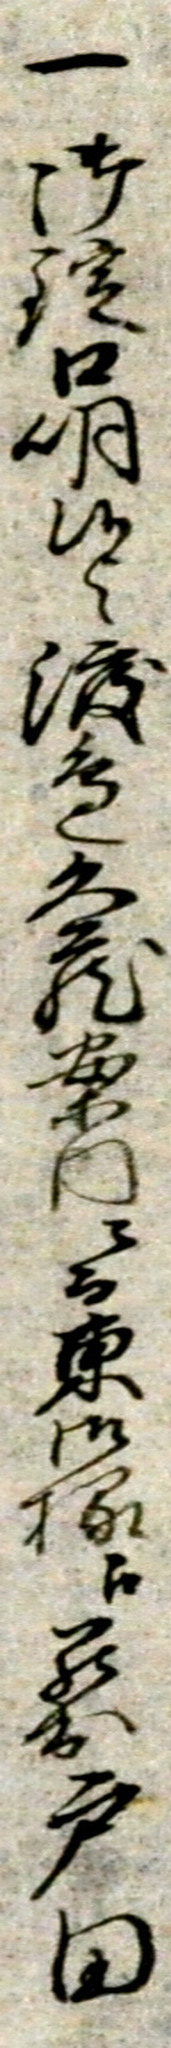一御錠口明候と渡辺久蔵案内ニ而東御縁江罷出戸田
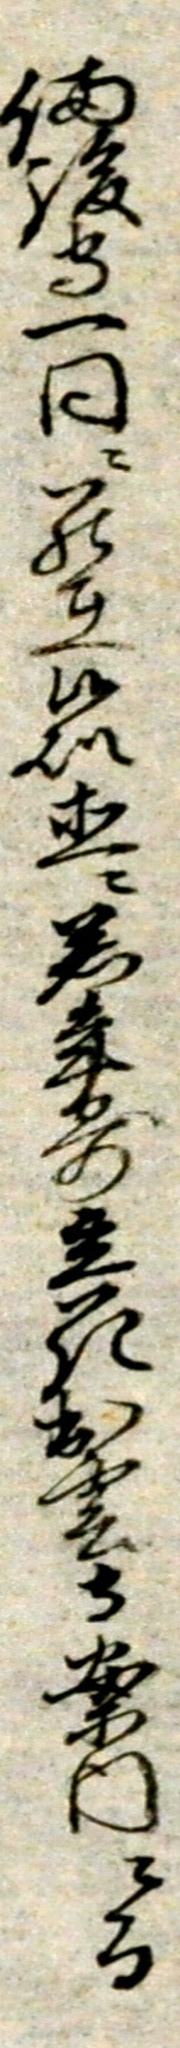備後守一同ニ罷在候処直ニ若年寄立花出雲守案内ニ而
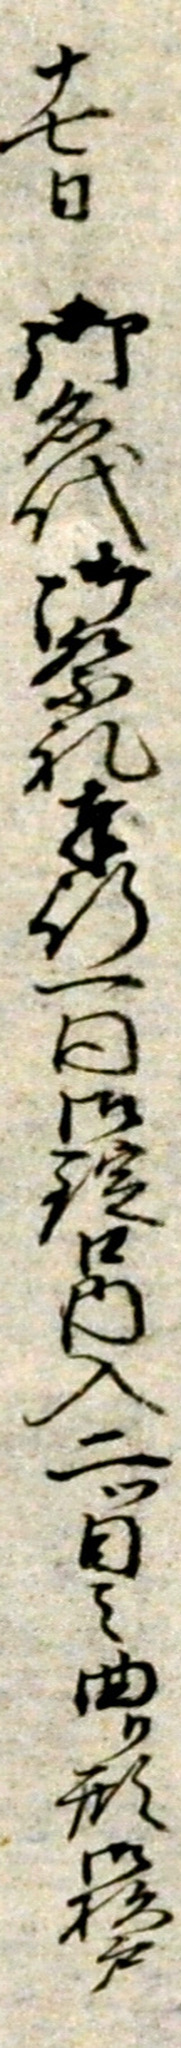十七日御名代御祭礼奉行一同御錠口二ッ目之曲り形御杉戸
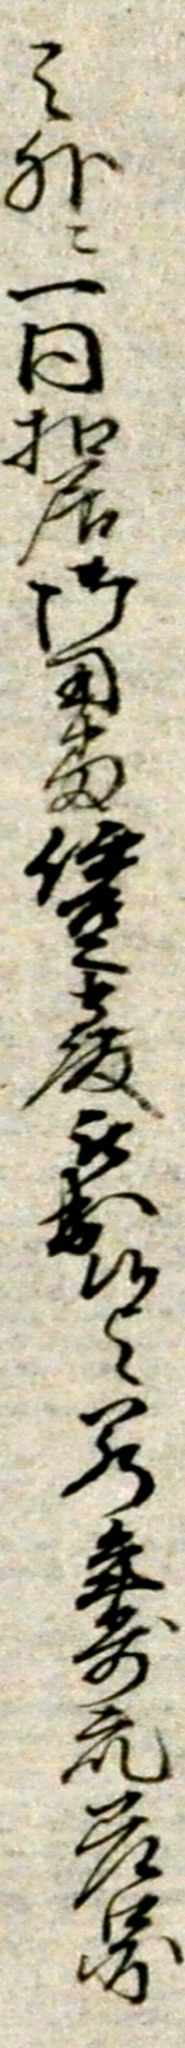之外二一同扣居御用番伊豆守殿被出候と若年寄衆差図
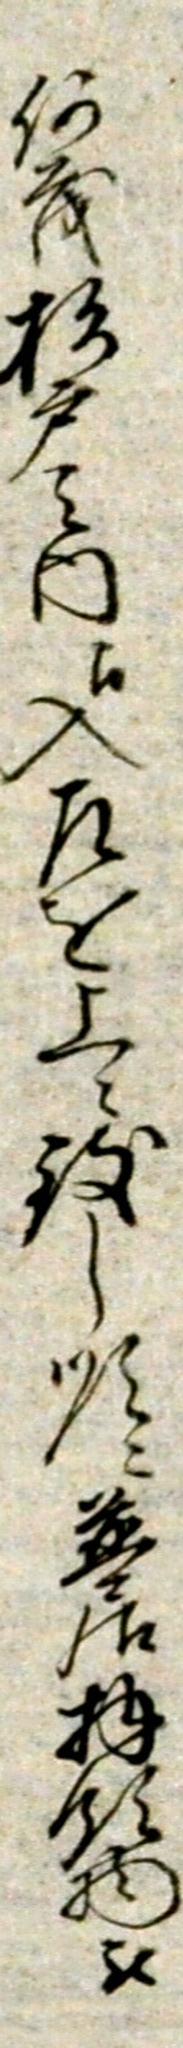何も杉戸之内江入左を上ニ致し順ニ並居拝領物被
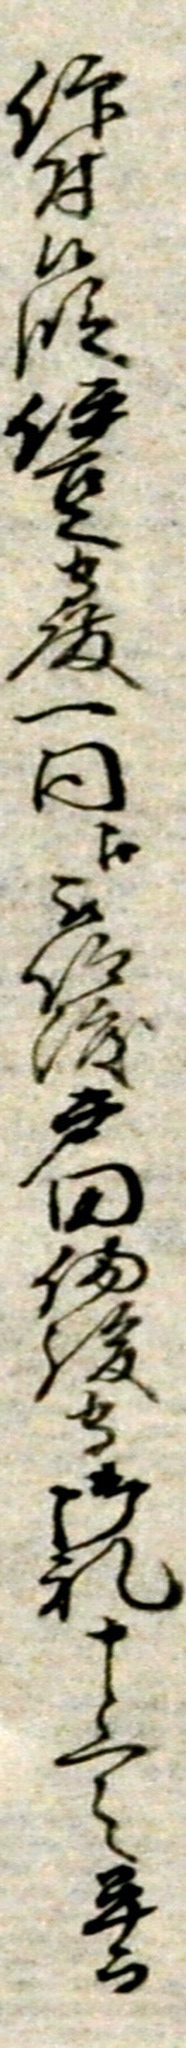仰付候段伊豆守殿一同江被仰渡戸田備後守御礼申上之畢而
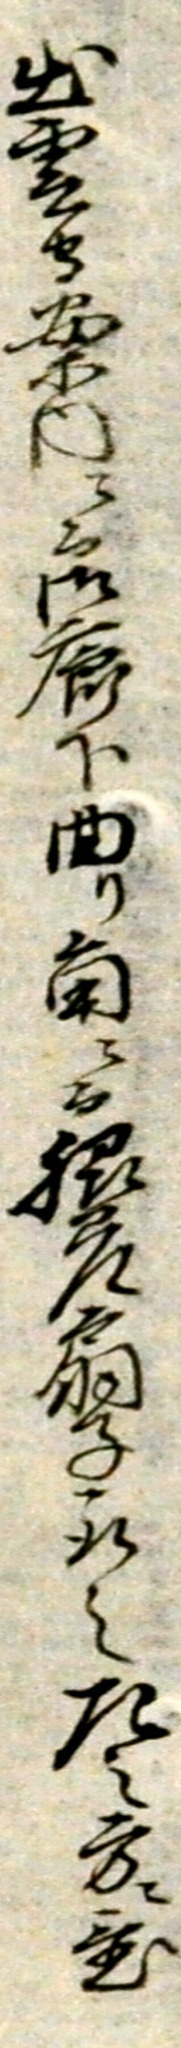出雲守案内ニ而御廊下曲り南二而脇差扇子取之左之方ニ置
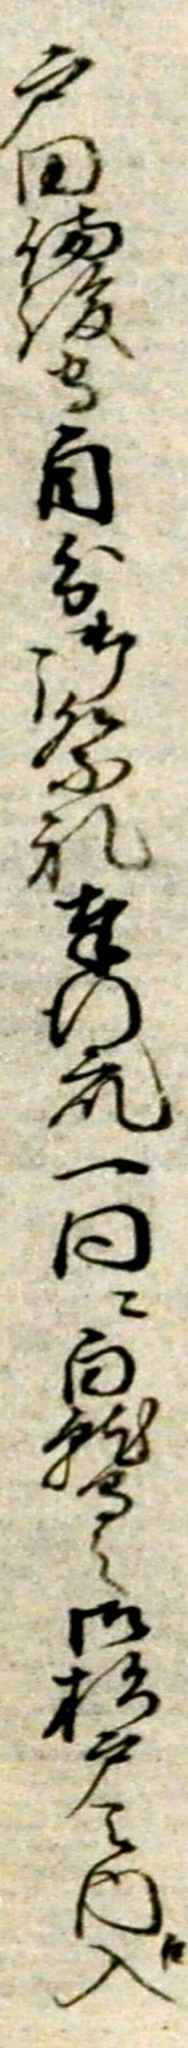戸田備後守自分御祭礼奉行衆一同ニ白鷲之御杉戸之内江入

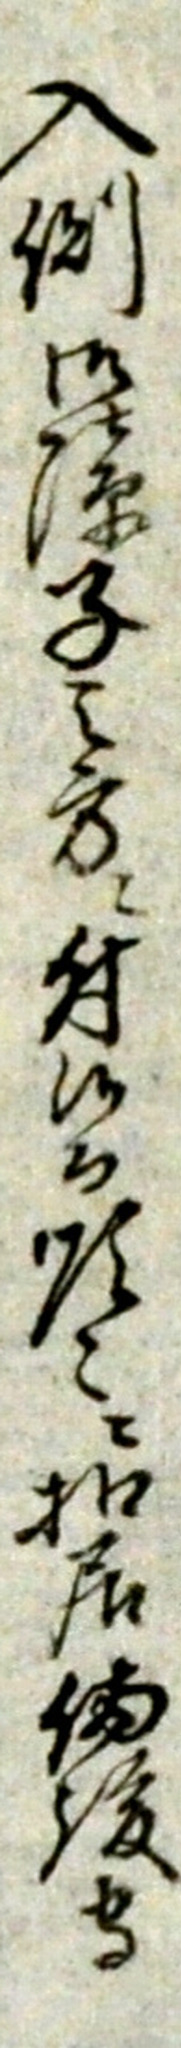入側御障子之方ニ付候而順々ニ扣居備後守
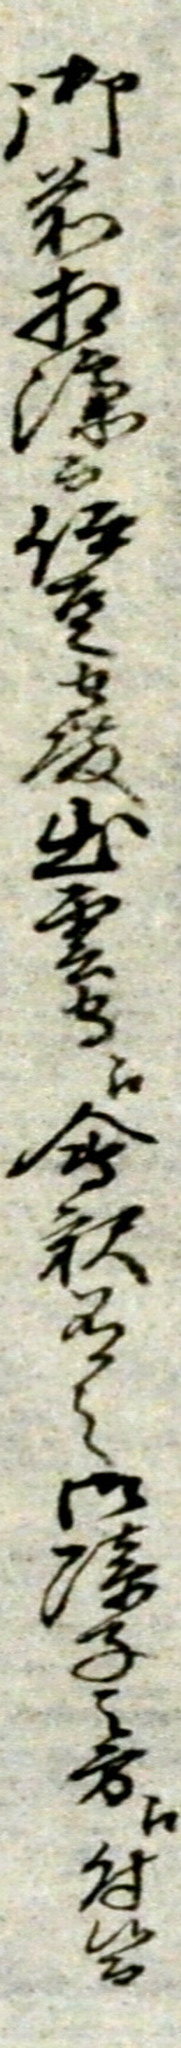御前相済而伊豆守殿出雲守江会釈有之御障子之方江付候而
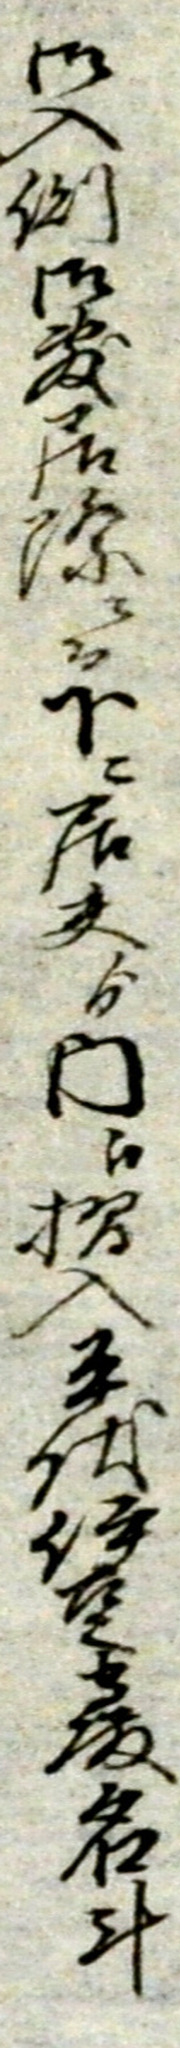御入側御敷居際ニ而下二居夫ゟ内江摺入平伏伊豆守殿名斗
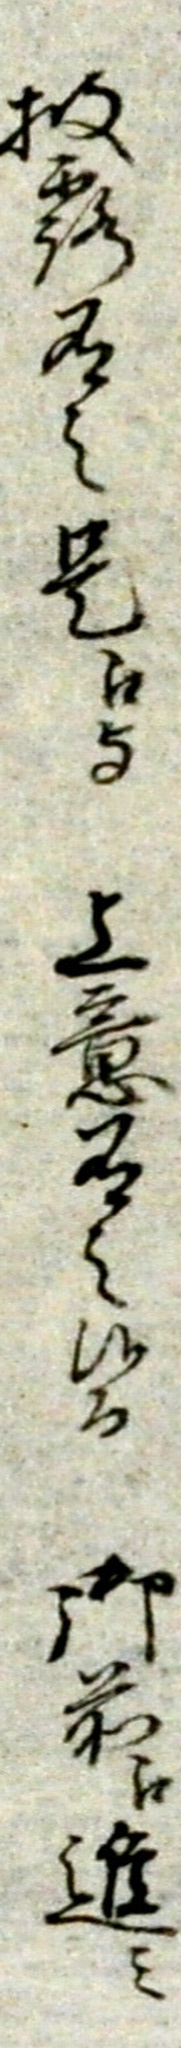披露有之是江と上意有之候而御前江進ミ
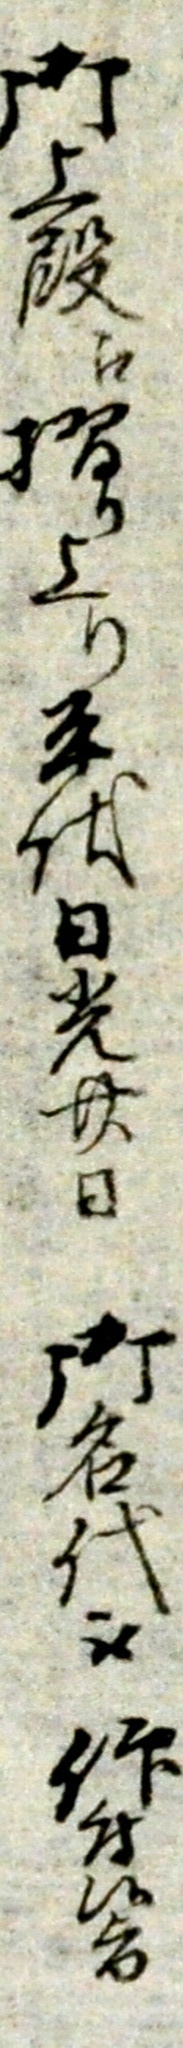御上段江摺り上り平伏日光廿日御名代被仰付候旨
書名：日光御名代相勤候節ノ留
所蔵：伊那市立高遠町図書館・合同会社AMANE
